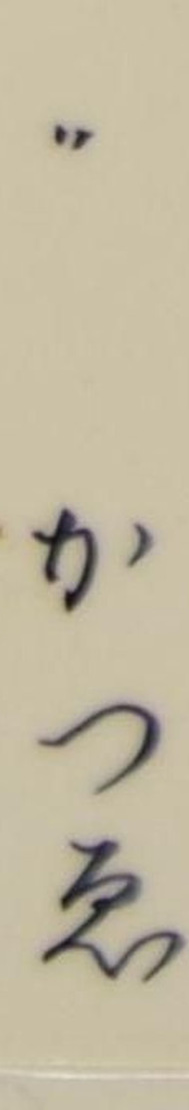かつゑ
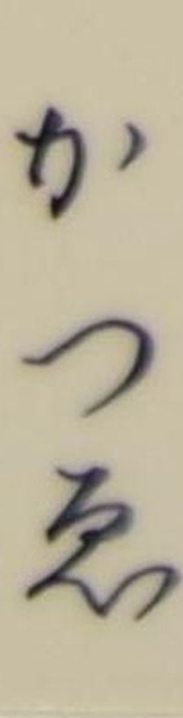かつゑ
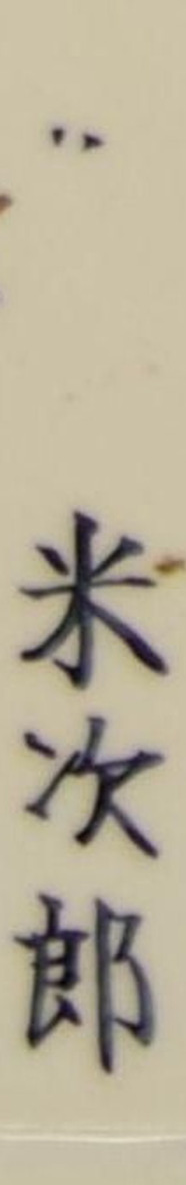米次郎
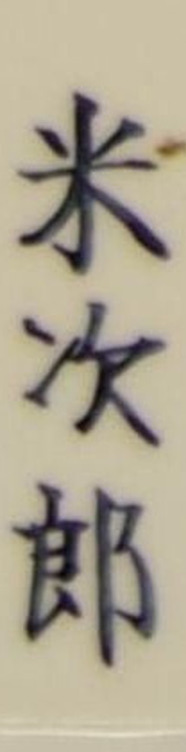米次郎
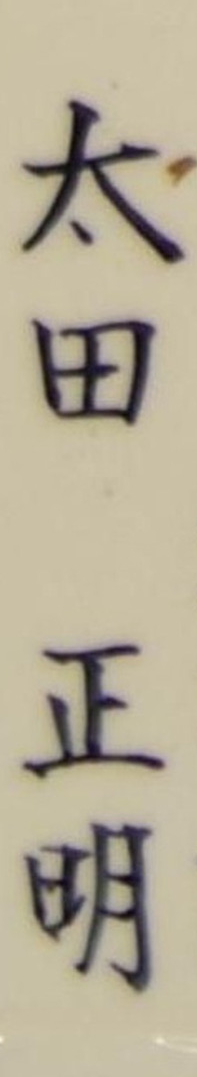太田正明
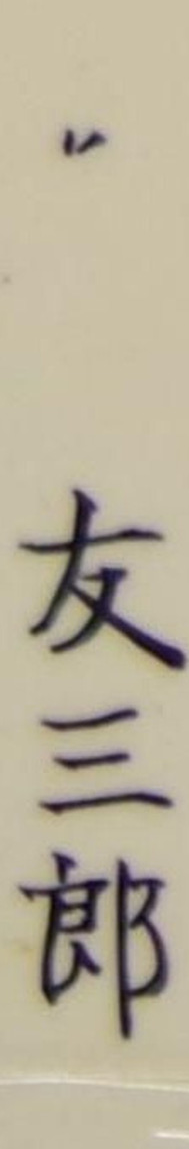友三郎
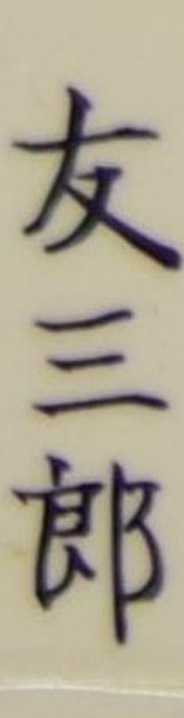友三郎
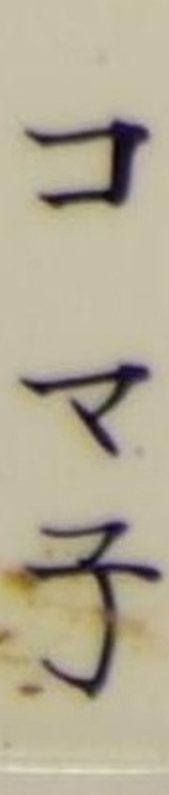コマ子

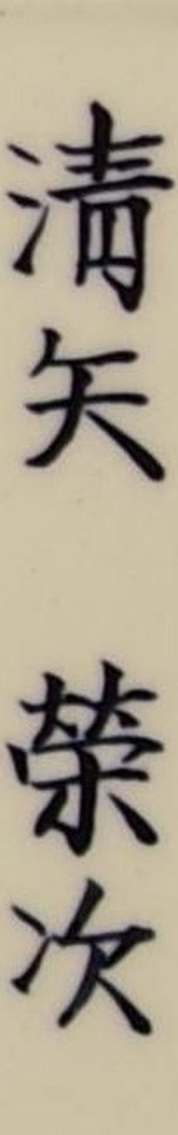清矢榮次
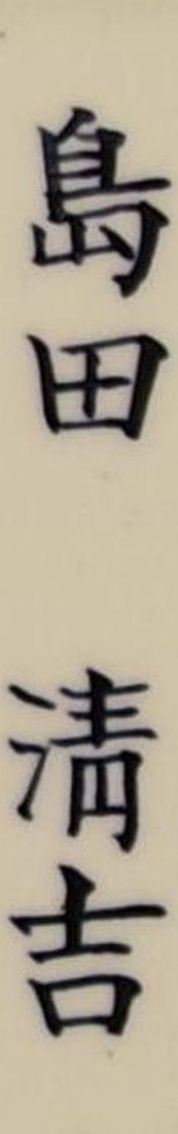島田清吉
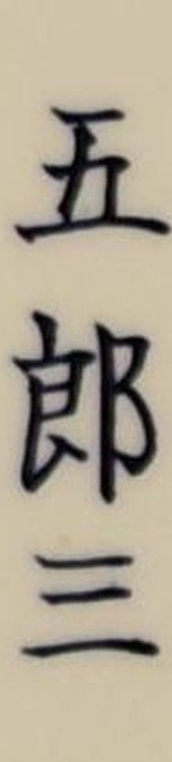五郎三
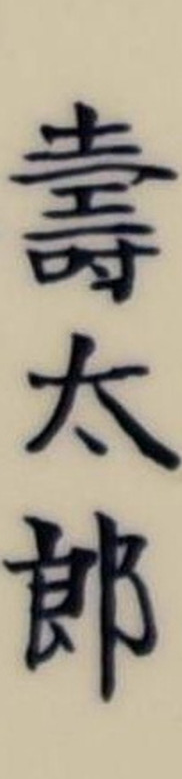壽太郎
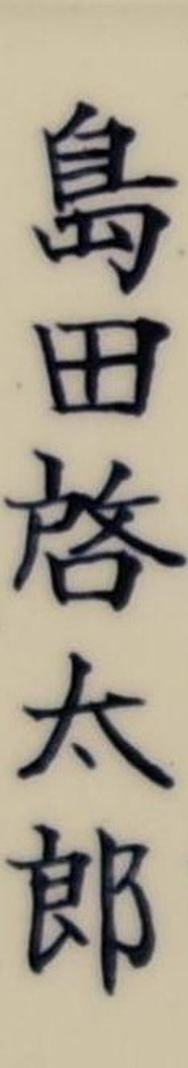島田啓太郎
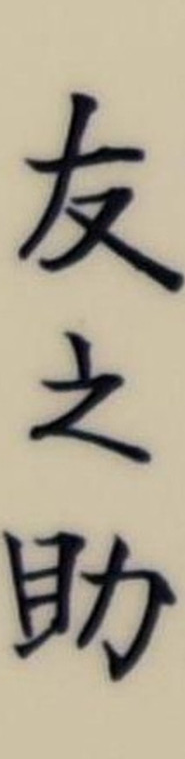友之助
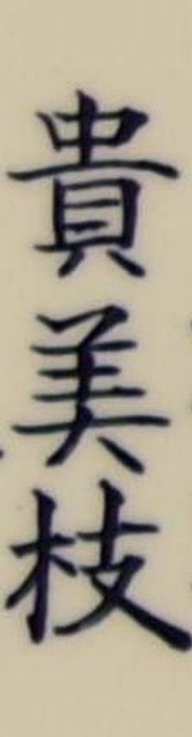貴美枝

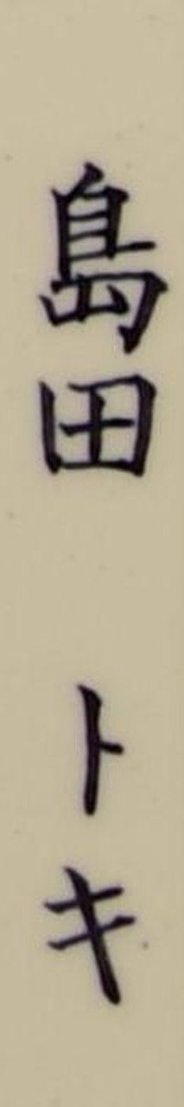島田トキ
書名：A~D
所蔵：koyasan kongobuji
